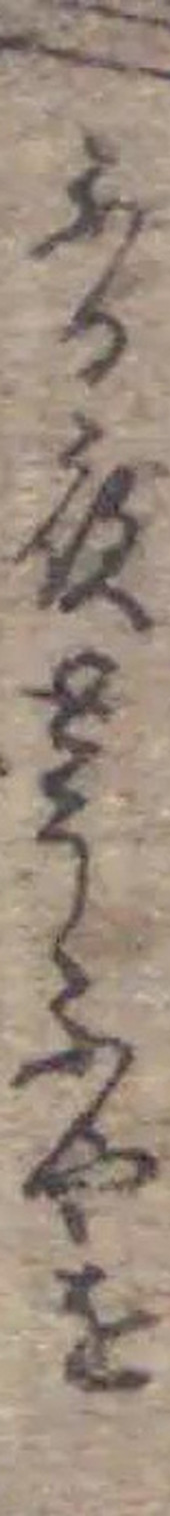ふる夜とうふやを
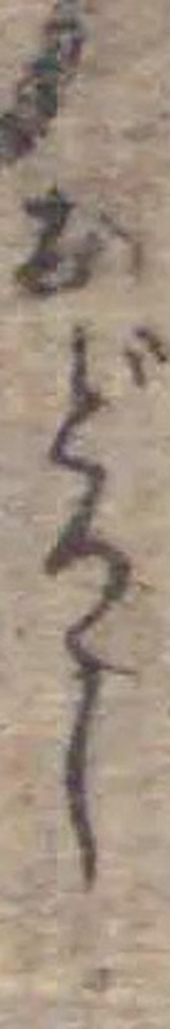おどかし

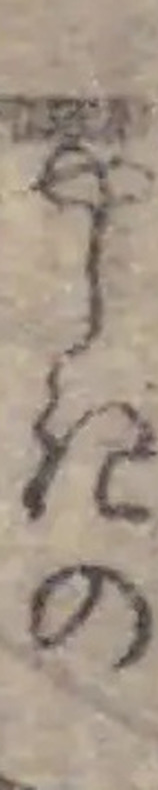やしきの
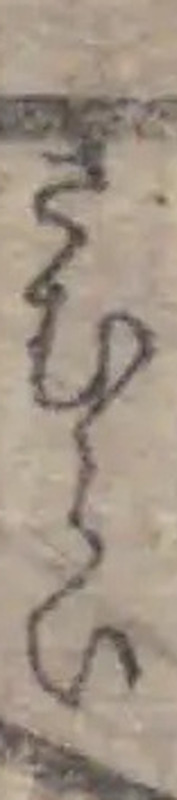さむらい
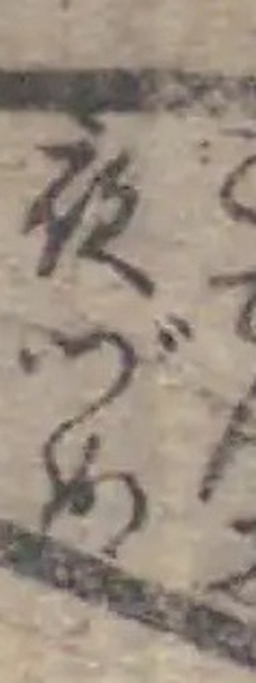夜づめ
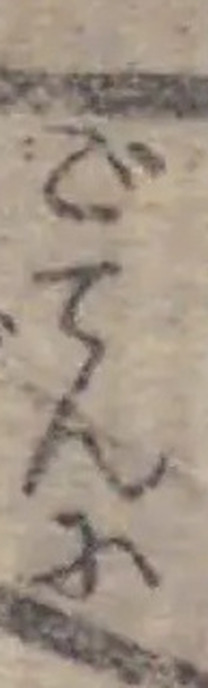ごてんに
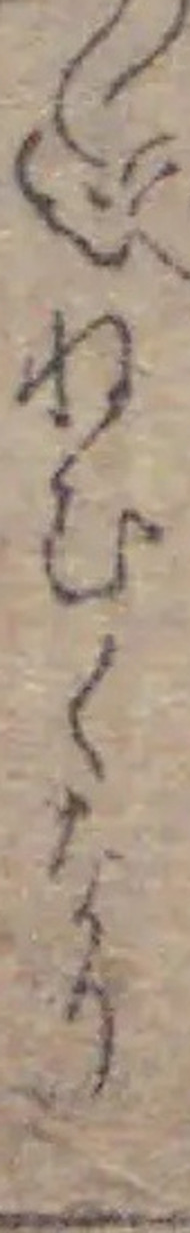ねむくなり
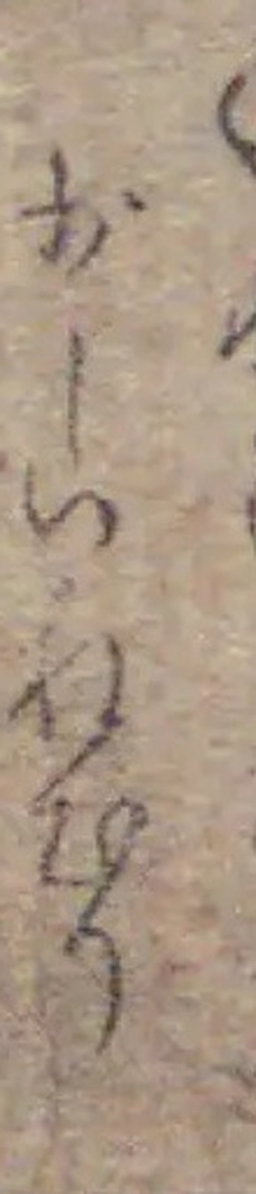少しいねむり
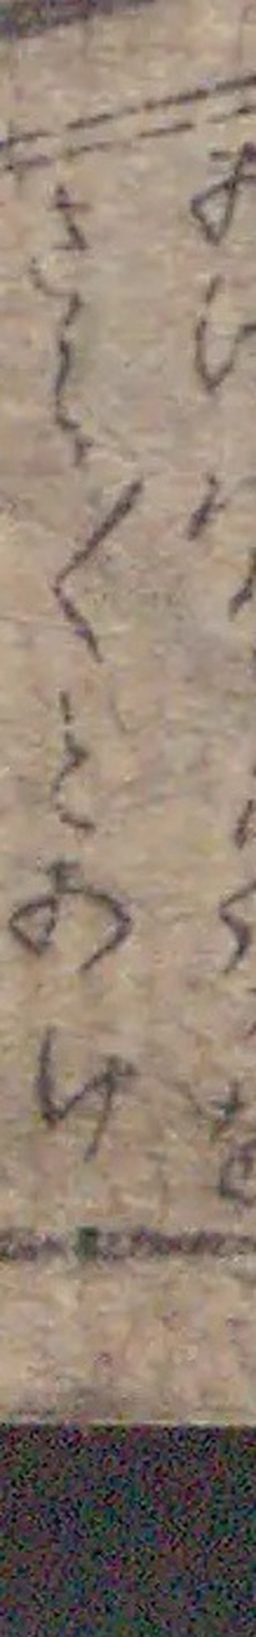さら〳〵とあけ
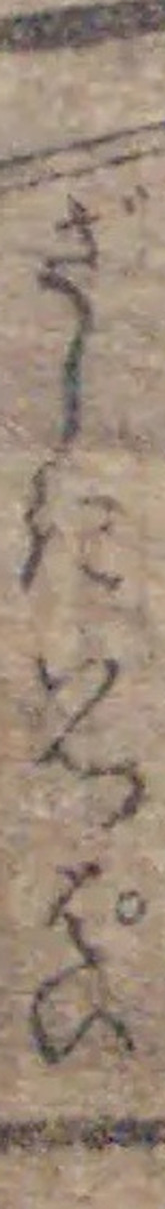ざしきいつぱい
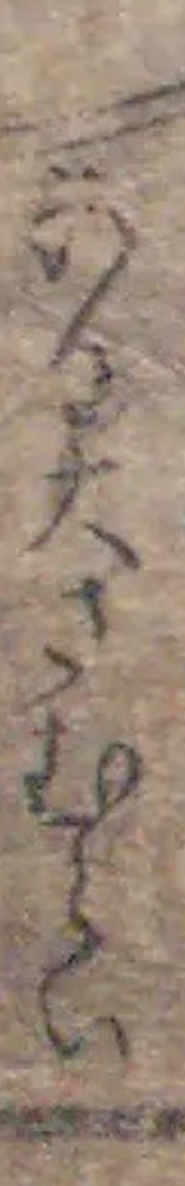ある大さむらい
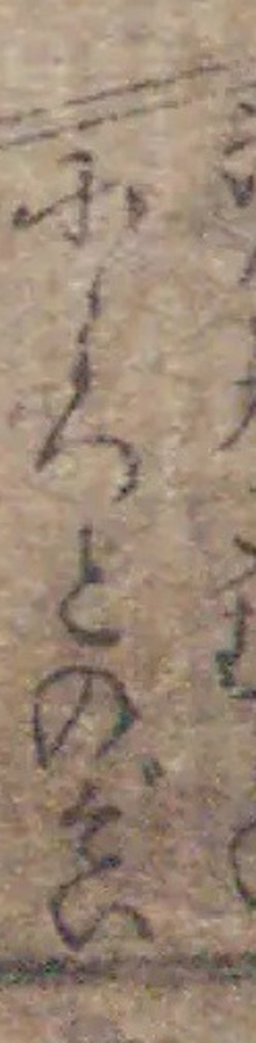によつとのぞい
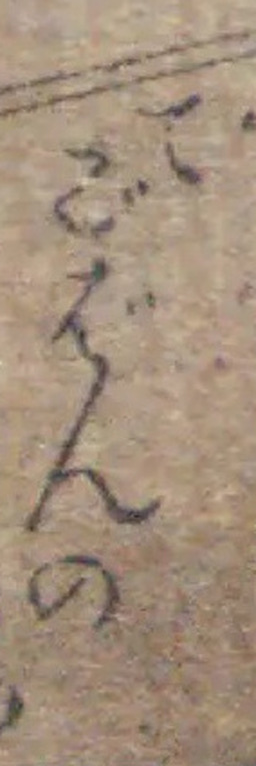ごばんの
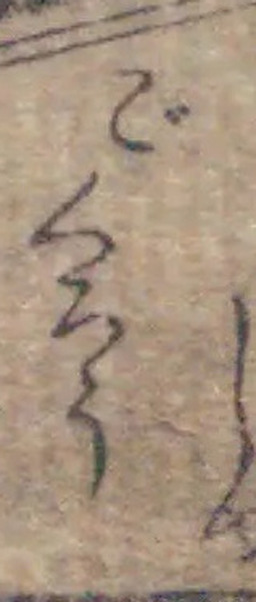ごくろう

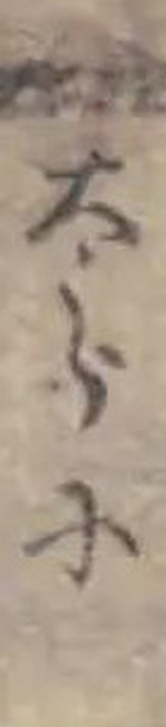太郎に
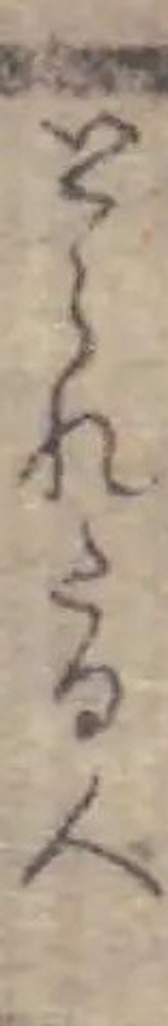とられたる人
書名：夭怪着到牒 2巻
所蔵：国立国会図書館 National Diet Library, JAPAN
